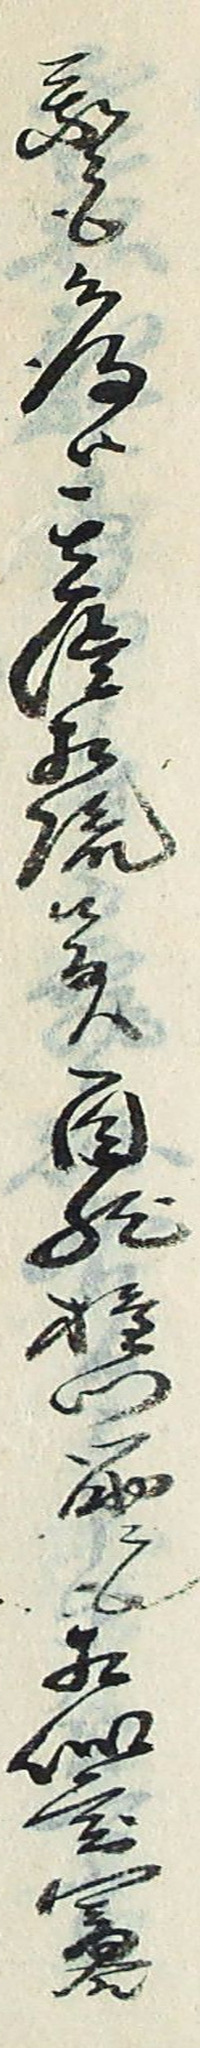義も候得ハ其儘相流候而ハ自然権門筋ニも相似寄響合
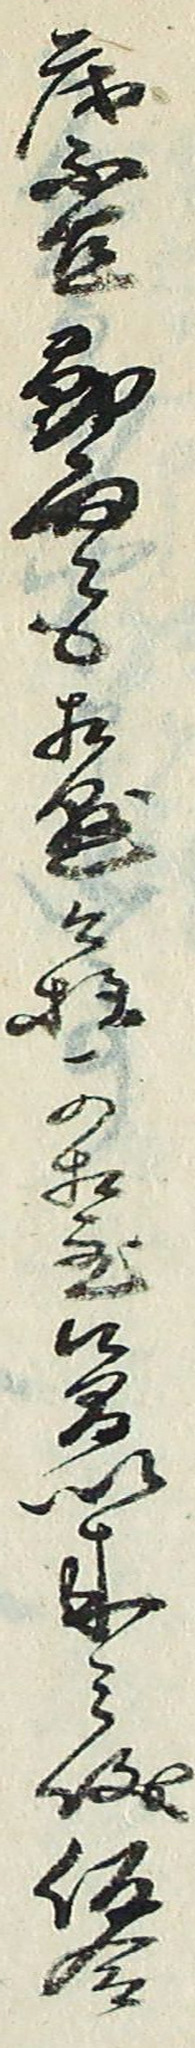も不宜勤向ニも相懸候様可相至候間以来之儀仮令
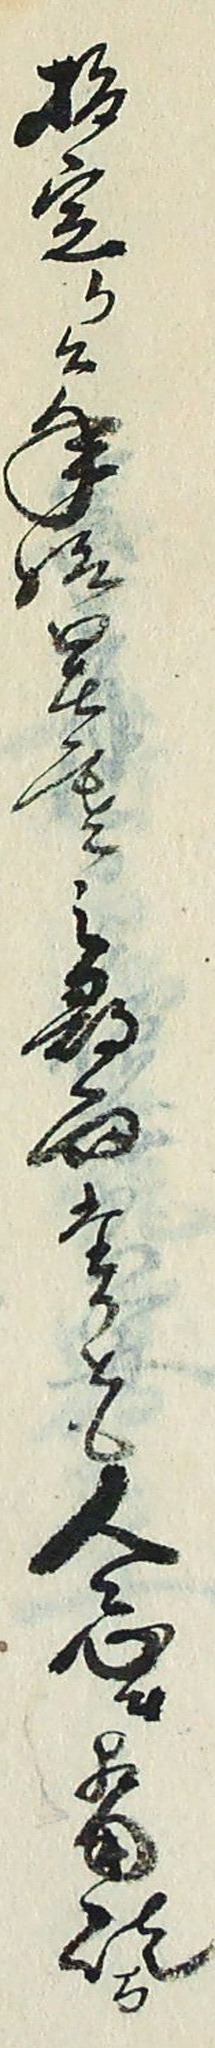指定り候年始暑寒之尋向たりとも人々心ヲ相用屹と
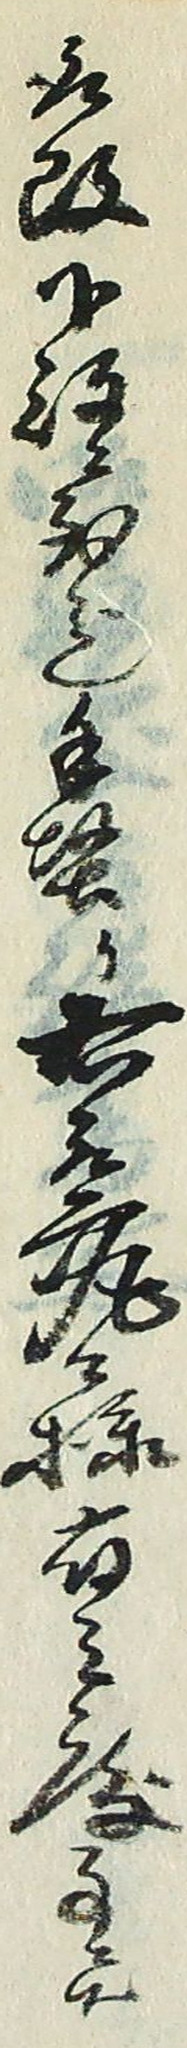取改下役ニ至迄而堅ク右取究候様有之度事ニ候
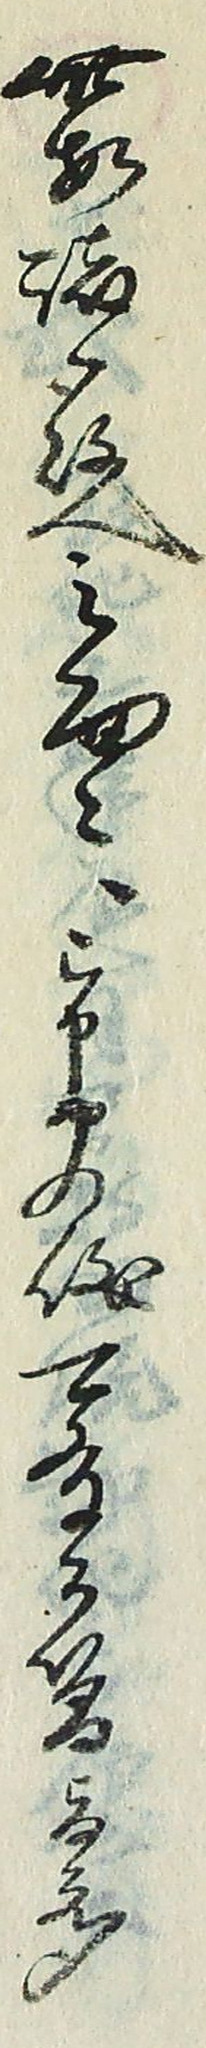此段諸御役人之面々へ被申聞儀可有了簡旨元〆
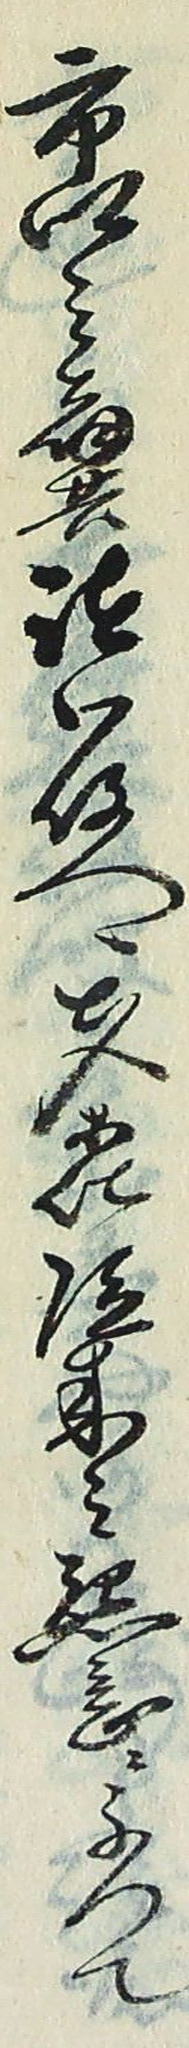市郷之者共諸御役人へ出入等仕従来之懇意ニよつて
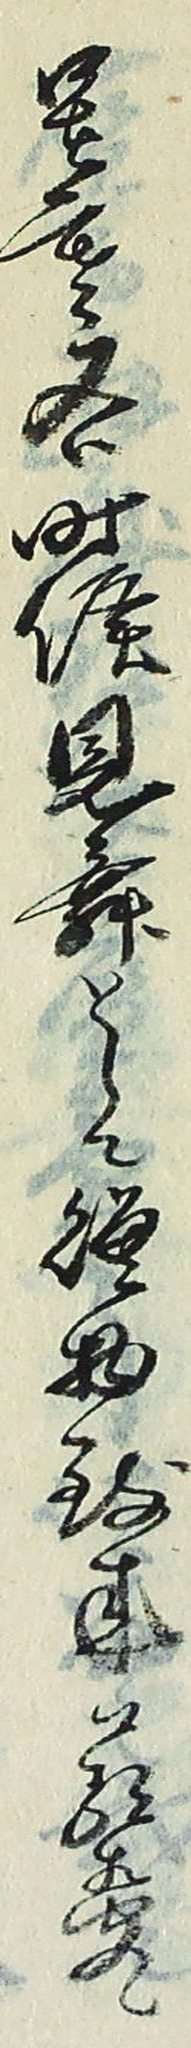暑寒又ハ時候見舞として贈物致来候類相聞候
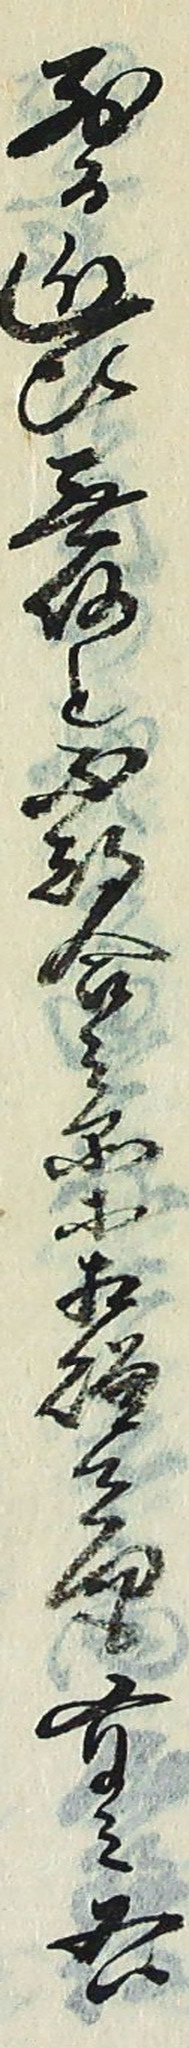別而近比無何と不都合之品等相贈候向も有之右
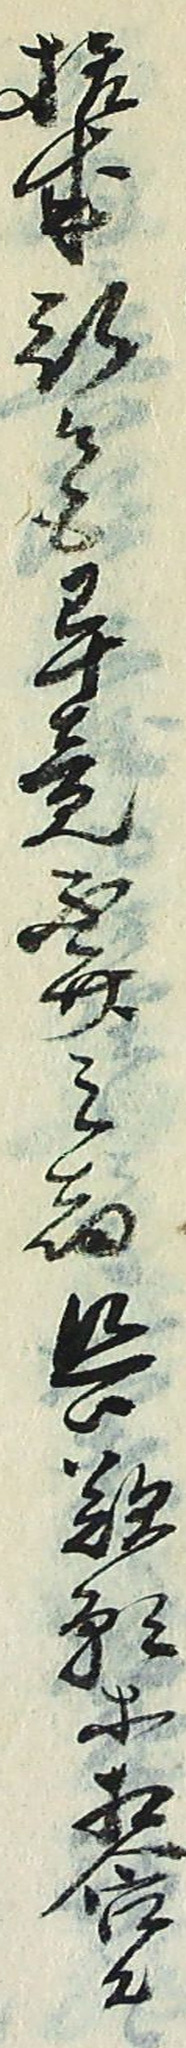様成行候も畢竟不弁之者且ハ歎願等相含候
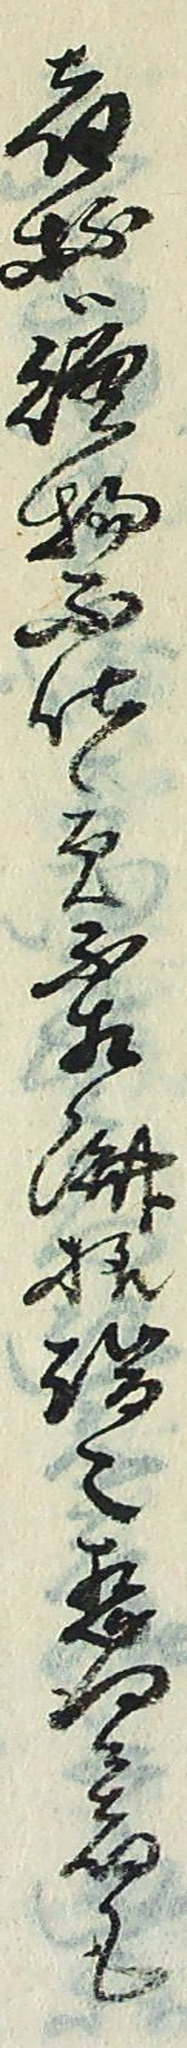者抔ハ贈物不仕候而ハ不相済様端々相心得候者も
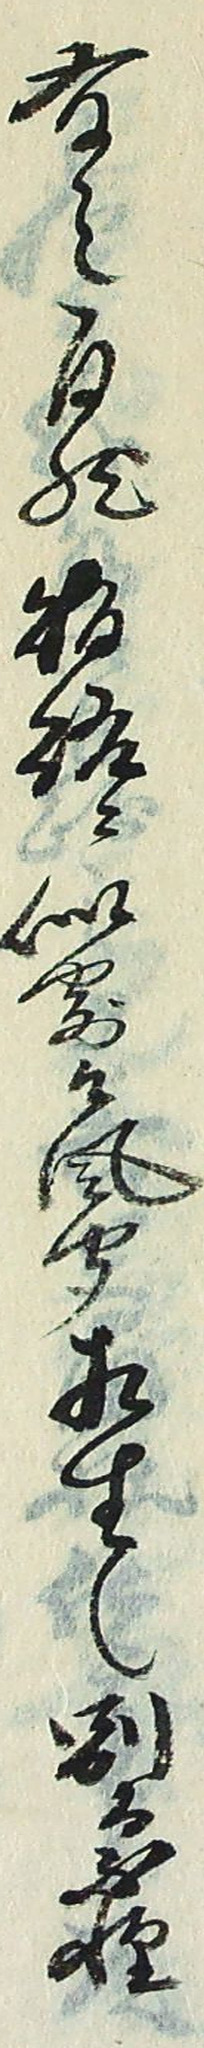有之自然賄賂ニ似寄候風聞相生し別而不軽
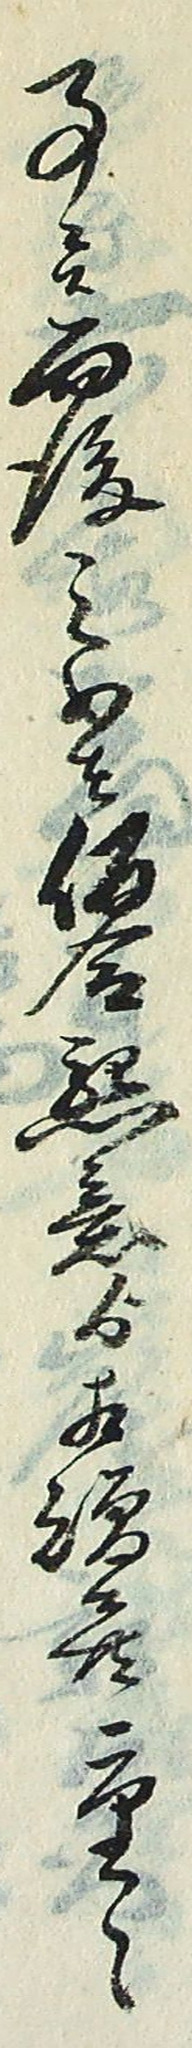事ニ候向後之義者仮令懇意ゟ相贈候共重々
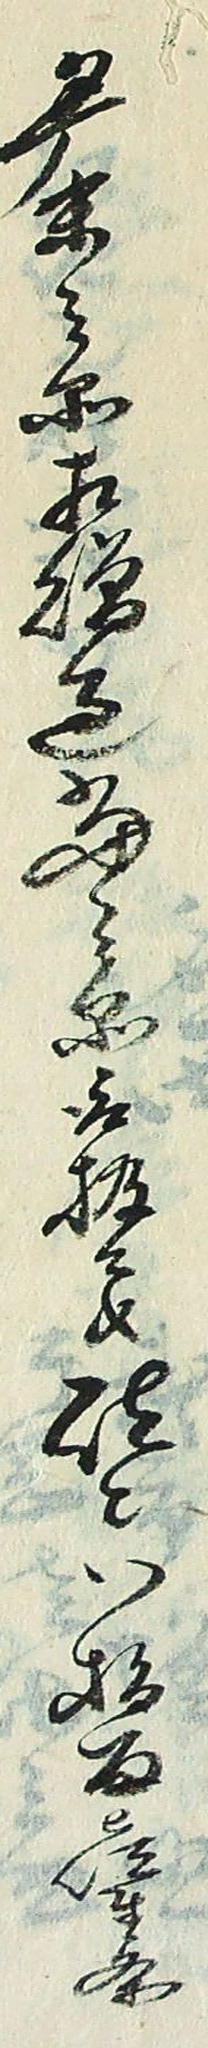麁末之品相贈過當之品取扱候義屹と御指留被仰付候条
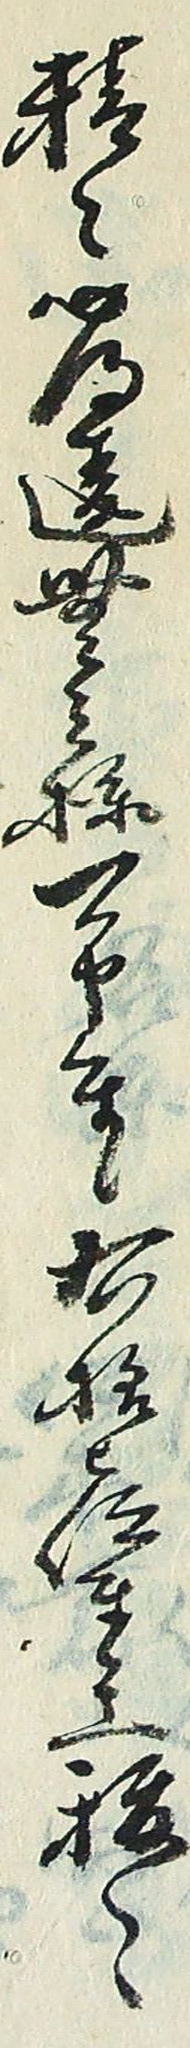精々心得違無之様可申付候右様被仰付候上複々
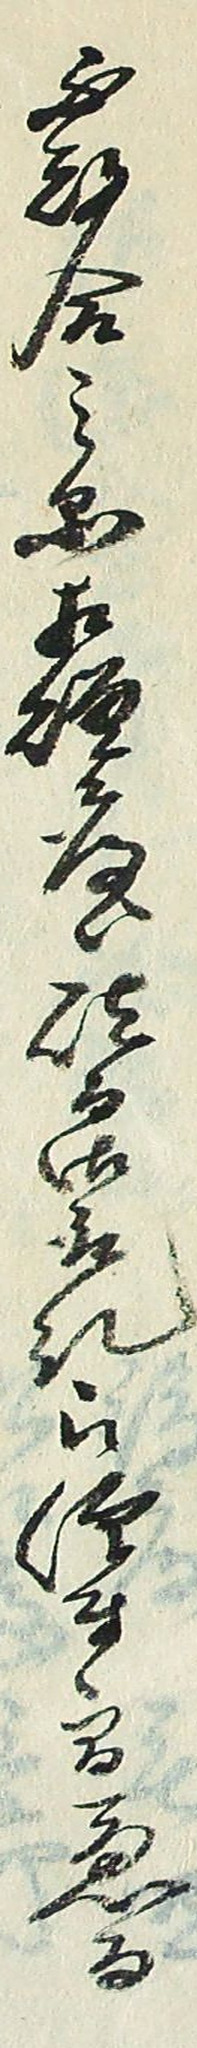不都合之品相贈候得ハ屹と御取糺被仰付候間兼而

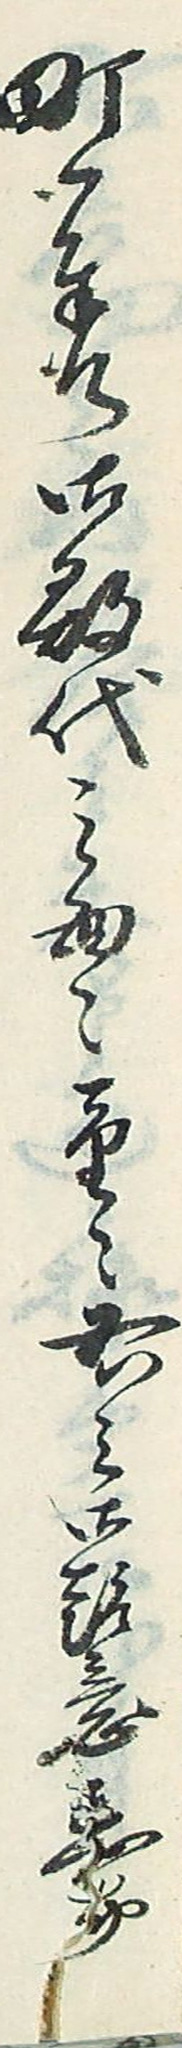町御奉行御郡代之面々重々右之御趣意忘却
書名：諸御趣意書并御下知向之写
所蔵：鳴門教育大学 Naruto University of Education
